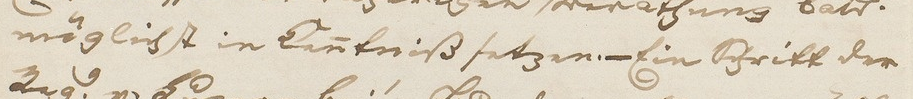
möglichst in Kenntniß setzen. – Ein Schritt der
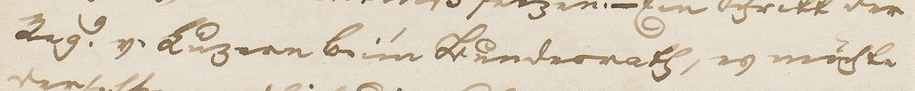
Reg. v. Luzern bei'm Bundesrath, es möchte
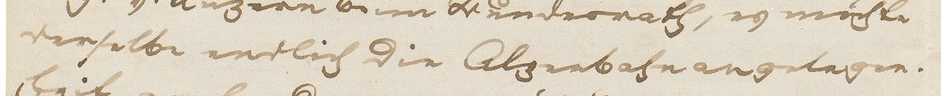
derselbe endlich die Alpenbahnangelegen-
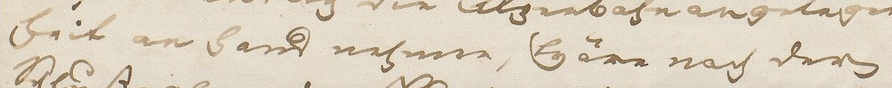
heit an Hand nehmen, wäre nach der
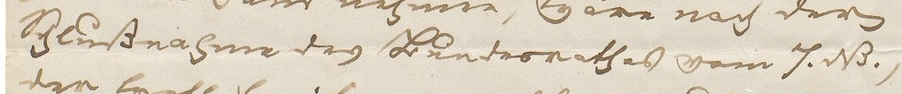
Schlußnahme des Bundesrathes vom 7. dß.,
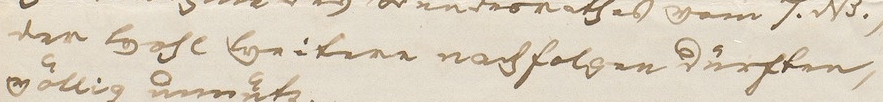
der wohl weitere nachfolgen dürften,
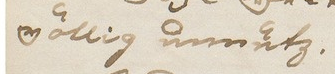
völlig unnütz.
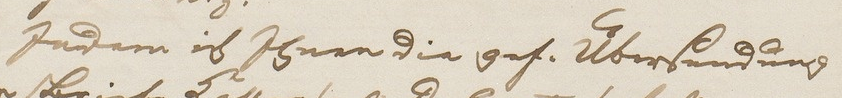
Indem ich Ihnen die gef. Übersendung
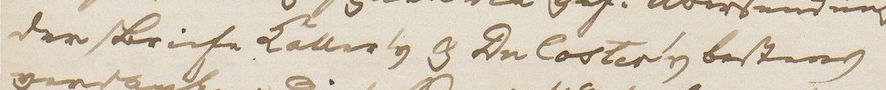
der Briefe Koller's & Du Coster's bestens
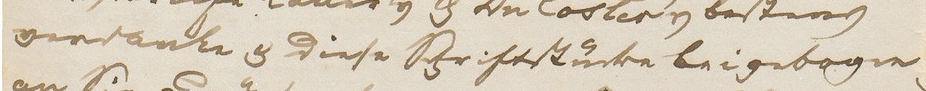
verdanke & diese Schriftstücke beigebogen
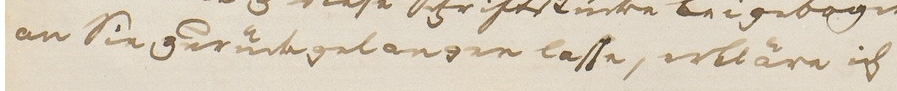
an Sie zurückgelangen lasse, erkläre ich
